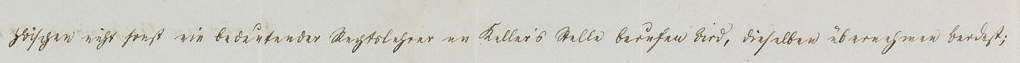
zwischen nicht sonst ein bedeutender Rechtslehrer an Keller's Stelle berufen wird, dieselben übernehmen werdest;
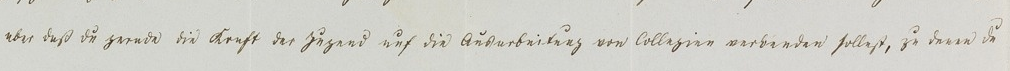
aber daß Du gerade die Kraft der Jugend auf die Ausarbeitung von Collegien verwenden sollest, zu denen Du
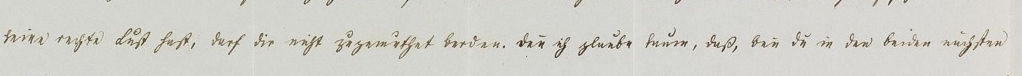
keine rechte Lust hast, darf Dir nicht zugemuthet werden. Denn ich glaube kaum, daß, wenn Du in den beiden nächsten
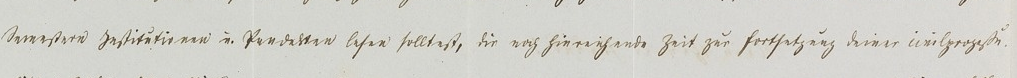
Semestern Institutionen u. Pandekten lesen solltest, Dir noch hinreichende Zeit zur Fortsetzung Deiner civilprozessu-
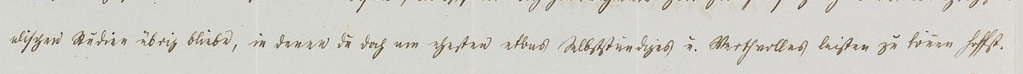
alischen Studien übrig bliebe, in denen Du doch am ehesten etwas Selbstständiges u. Werthvolles leisten zu können hoffst.
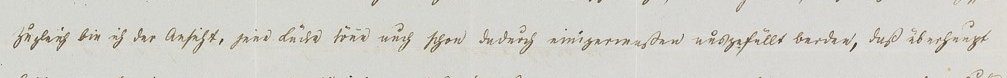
Zugleich bin ich der Ansicht, jene Lücke könne auch schon dadurch einigermaßen ausgefüllt werden, daß überhaupt
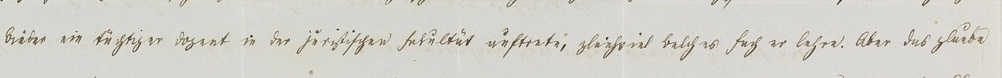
wieder ein tüchtiger Dozent in der juristischen Fakultät auftrete, gleichviel welches Fach er lehre. Aber das glaube
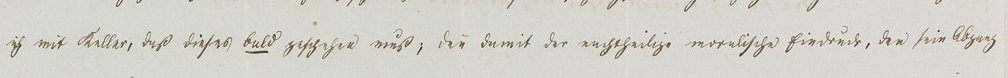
ich mit Keller, daß dieses bald geschehen muß; denn damit der nachtheilige moralische Eindruck, den sein Abgang
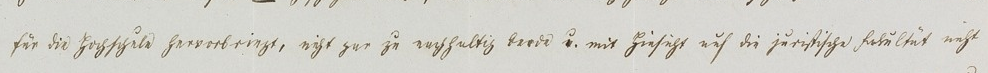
für die Hochschule hervorbringt, nicht gar zu nachhaltig werde u. mit Hinsicht auf die juristische Fakultät nicht
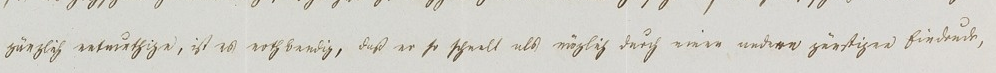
gänzlich entmuthige, ist es nothwendig, daß er so schnell als möglich durch einen andern günstigen Eindruck,
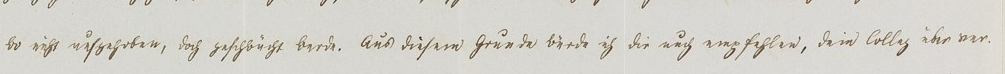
wo nicht aufgehoben, doch geschwächt werde. Aus diesem Grunde würde ich Dir auch empfehlen, Dein Colleg über ver-
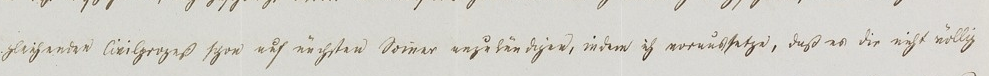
gleichenden Civilprozeß schon auf nächsten Sommer anzukündigen, indem ich voraussetze, daß es Dir nicht völlig
